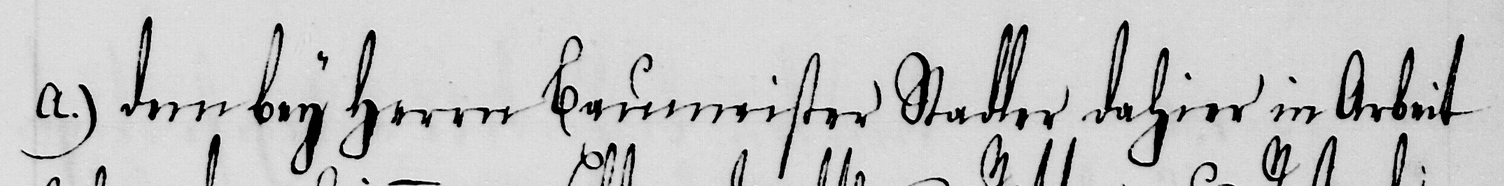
a.) dem bey Herrn Baumeister Stadler dahier in Arbeit
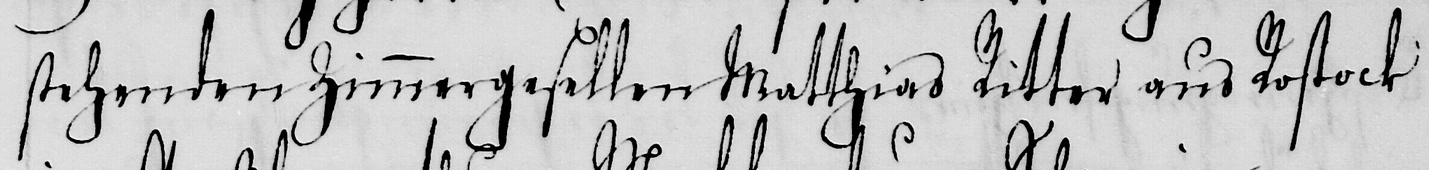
stehenden Zimmergesellen Matthias Ritter aus Rostock
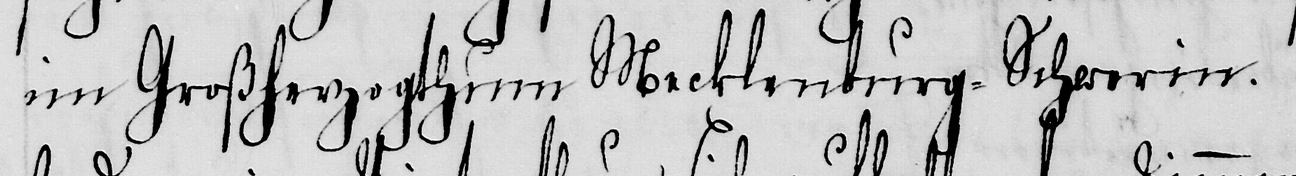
im Großherzogthum Mecklenburg-Schwerin.
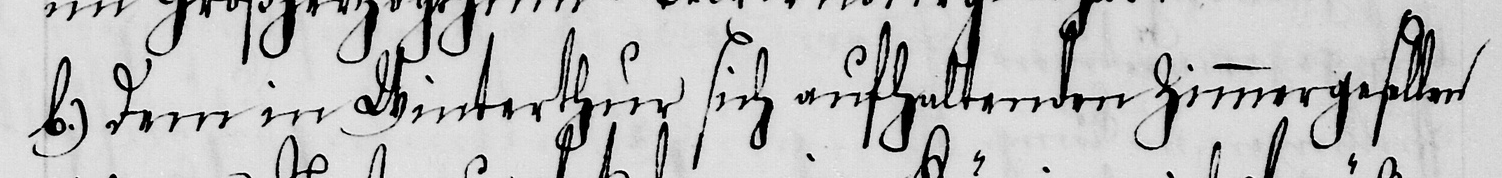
b.) Dem in Winterthur sich aufhaltenden Zimmergesellen
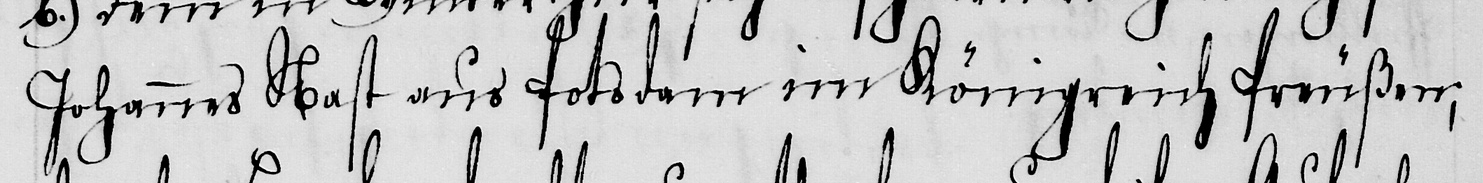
Johannes Nast aus Potsdam im Königreich Preußen;
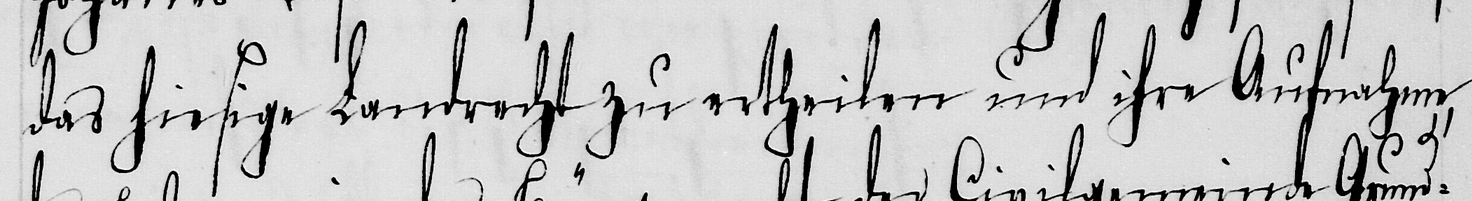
das hiesige Landrecht zu ertheilen und ihre Aufnahme,
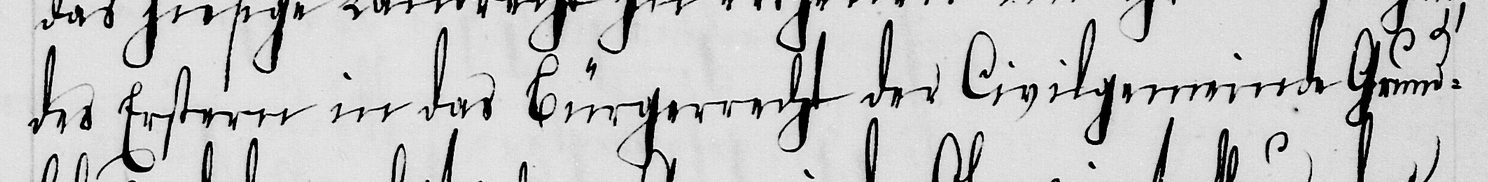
des Erstern in das Bürgerrecht der Civilgemeinde Grund¬
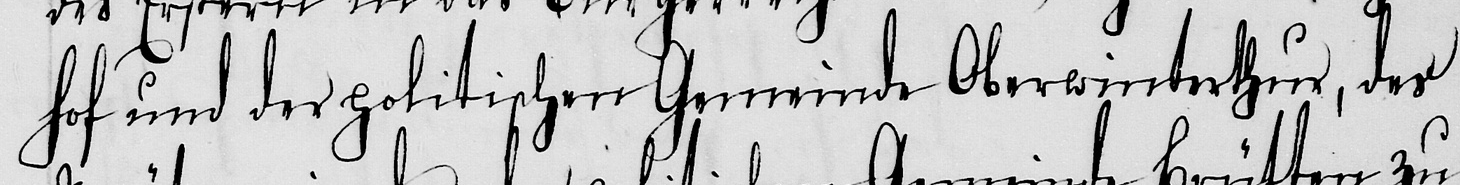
hof und der politischen Gemeinde Oberwinterthur, des
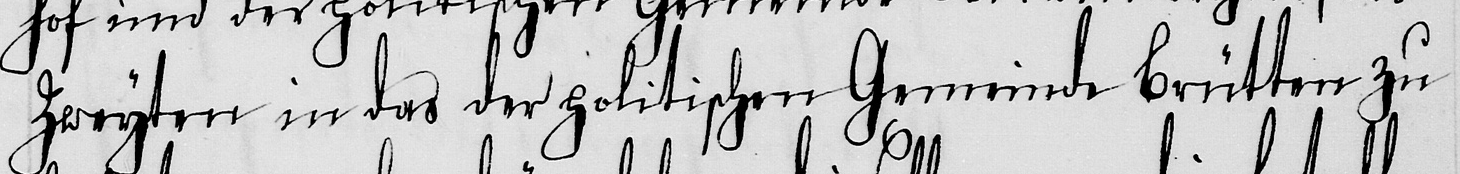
Zweyten in das der politischen Gemeinde Brütten zu
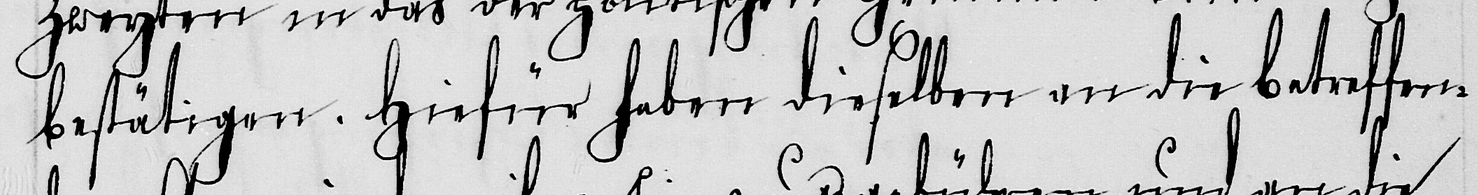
bestätigen. Hiefür haben dieselben an die betreffe¬
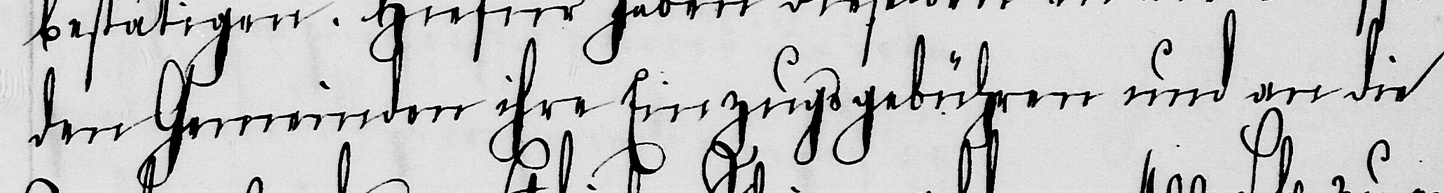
nden Gemeinden ihre Einzugsgebühren und an die
